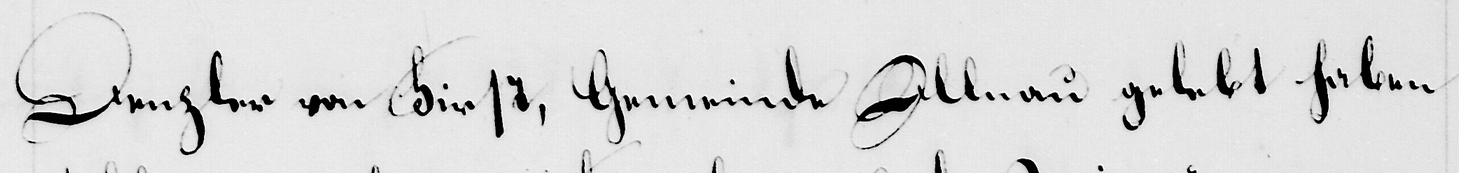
Denzler von First, Gemeinde Illnau gelebt haben
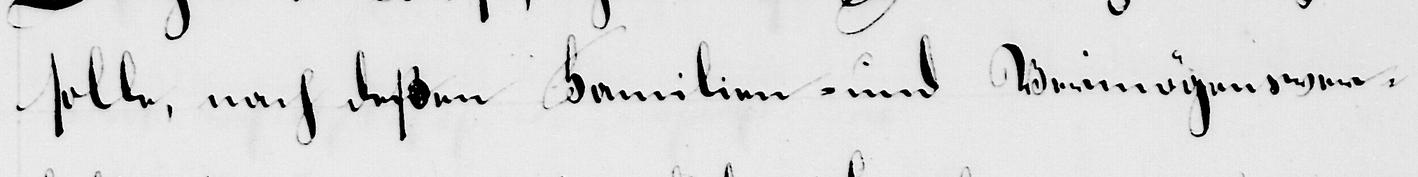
solle, nach deßen Familien- und Vermögensver¬
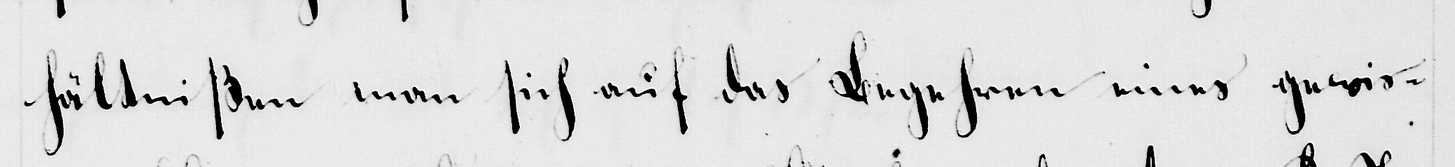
hältnißen man sich auf das Begehren eines gewis¬
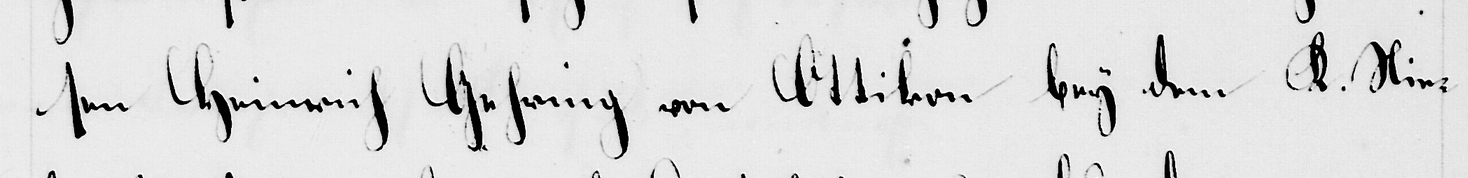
sen Heinrich Gehring von Ottikon bey dem K. Nie¬
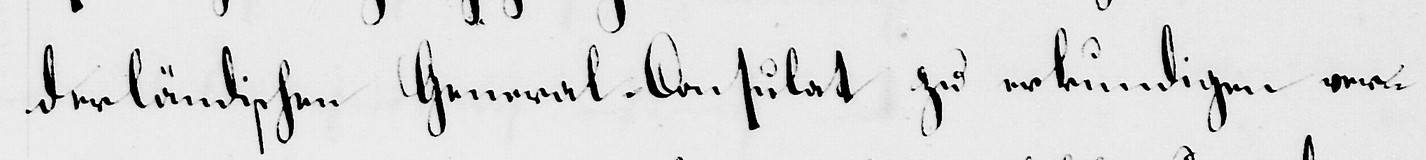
derländischen General-Consulat zu erkundigen ver¬
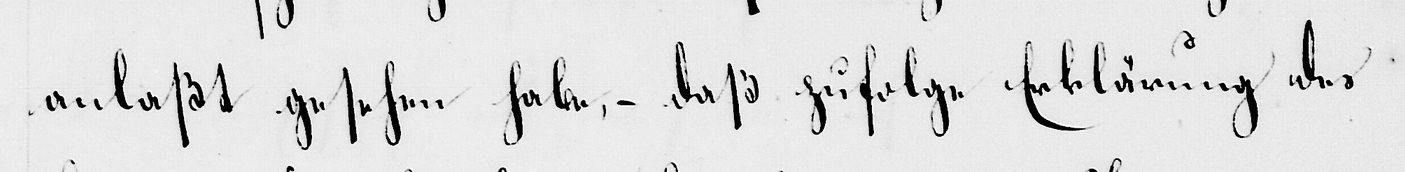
anlaßt gesehen habe, – daß zufolge Erklärung des
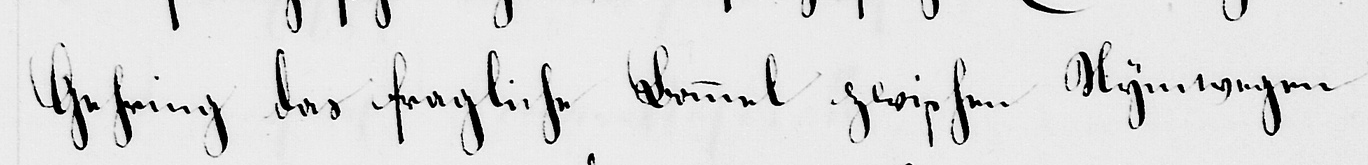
Gehring das fragliche Bommel zwischen Nymwegen
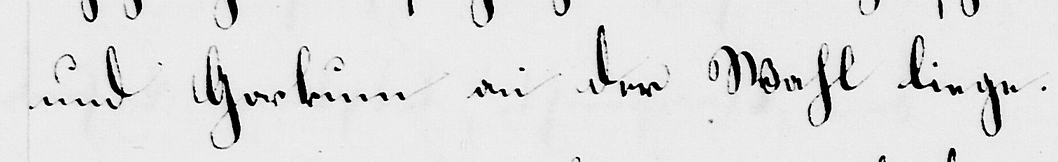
und Gorkum an der Wahl liege.
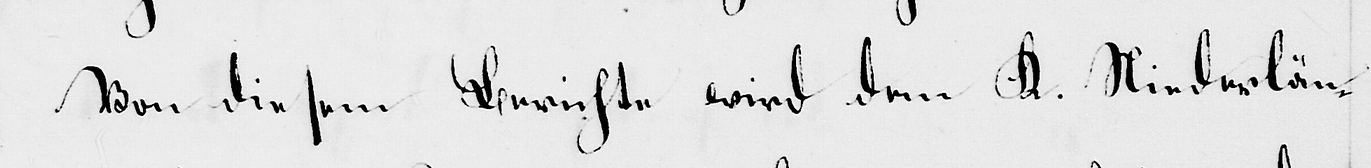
Von diesem Berichte wird dem K. Niederlän¬
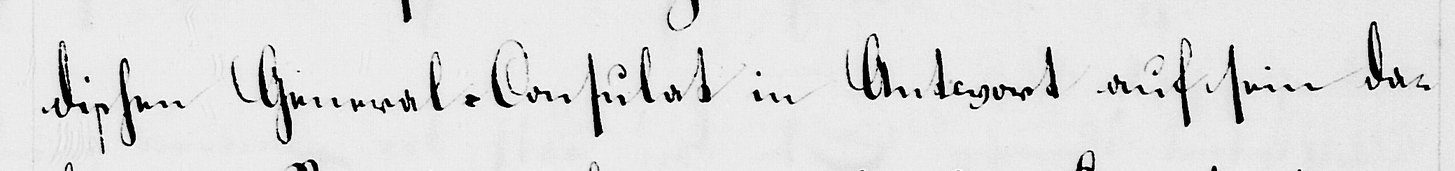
dischen General-Consulat in Antwort auf sein da¬
